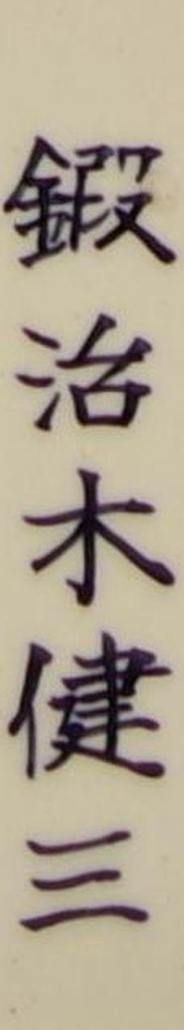鍛冶木健三
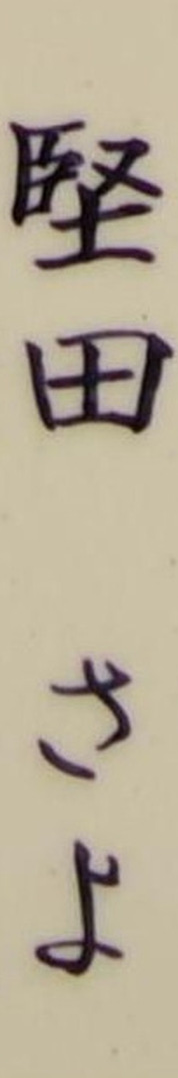堅田さよ
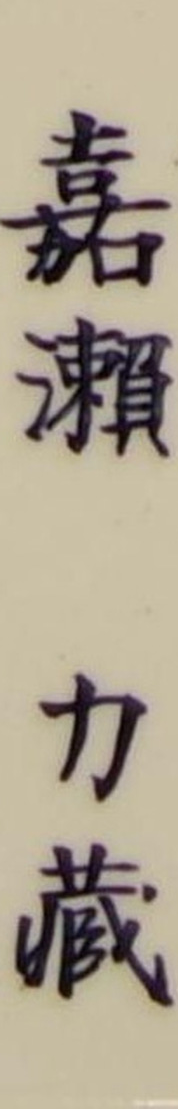嘉瀬力蔵
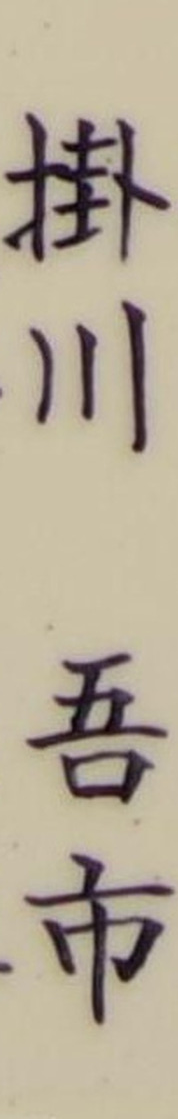掛川吾市
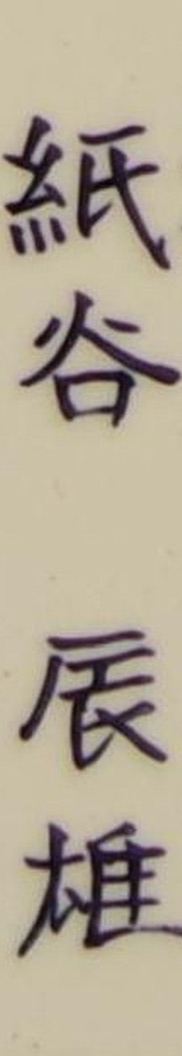紙谷辰雄
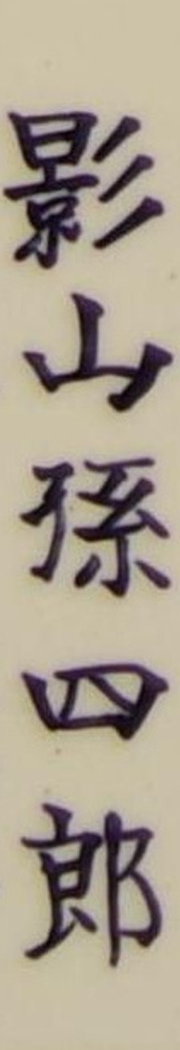影山孫四郎
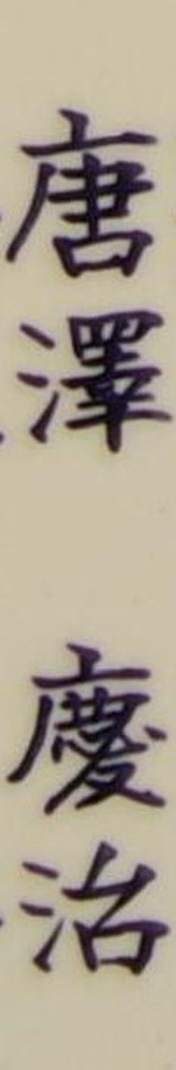唐澤慶治
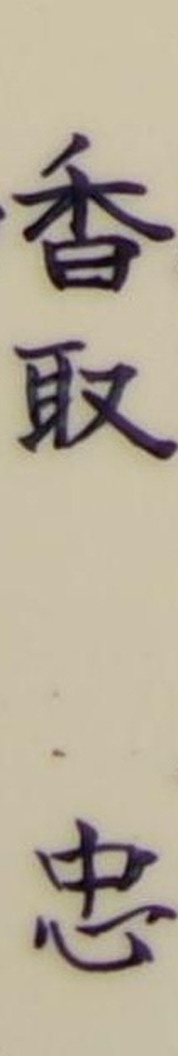香取忠

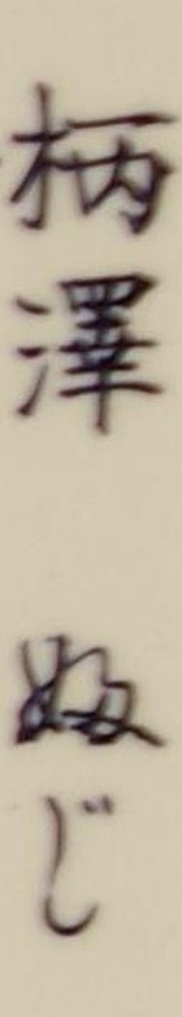柄澤ふじ
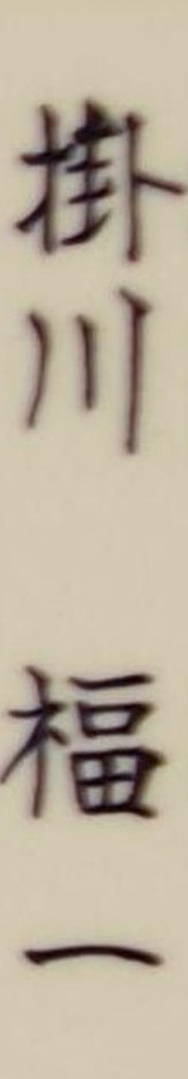掛川福一
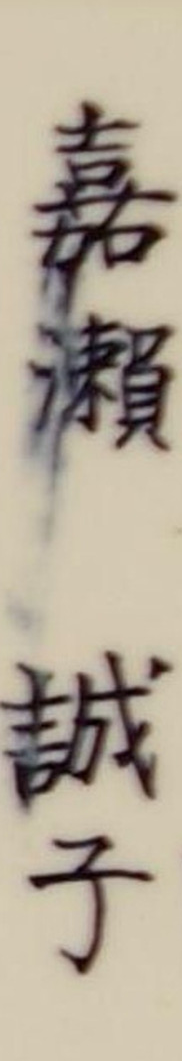嘉瀬誠子
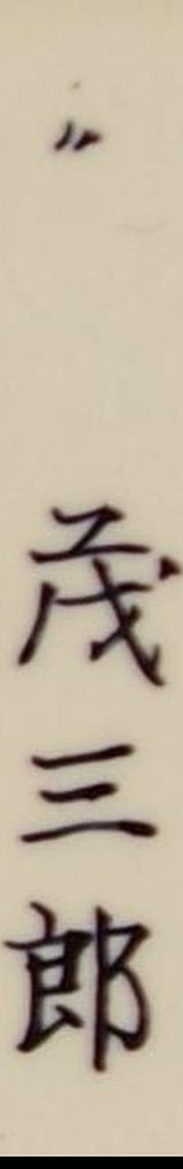茂三郎
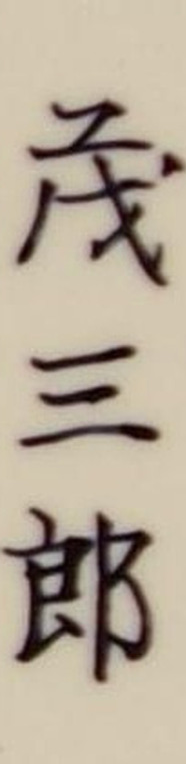茂三郎
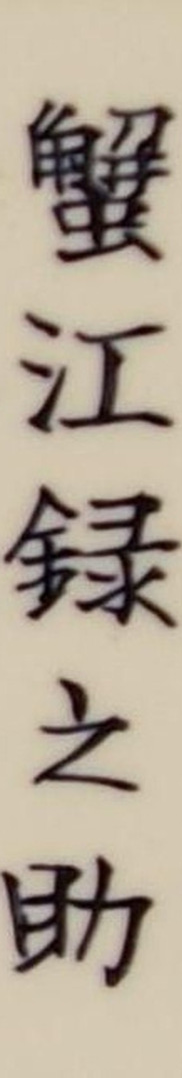蟹江録之助
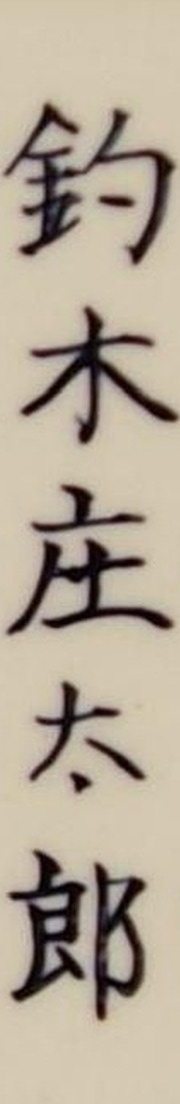釣木庄太郎
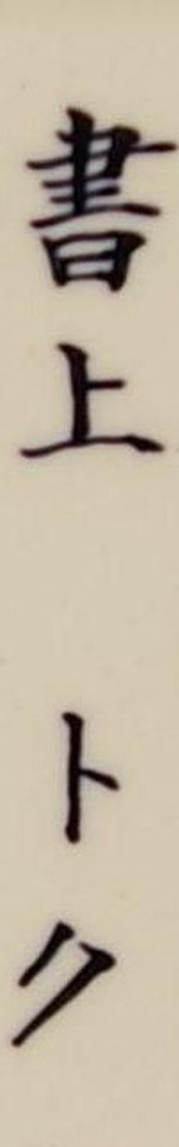書上トク
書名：E~L
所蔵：高野山金剛峯寺
